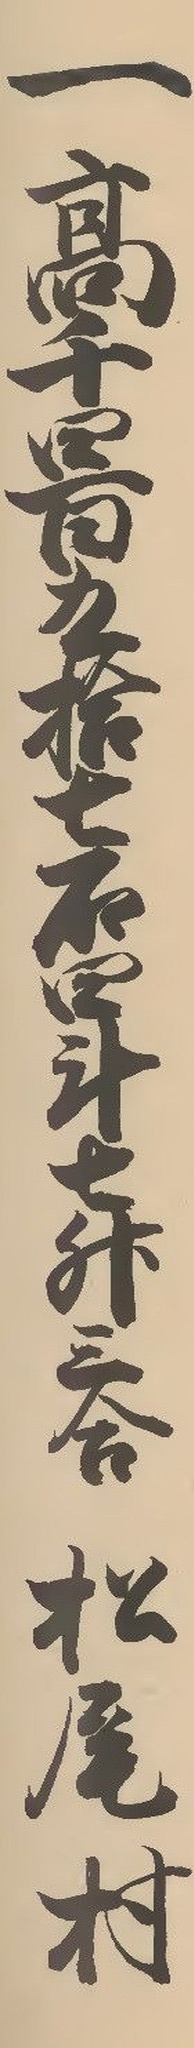一髙千四百九拾七石四斗七升三合松尾村
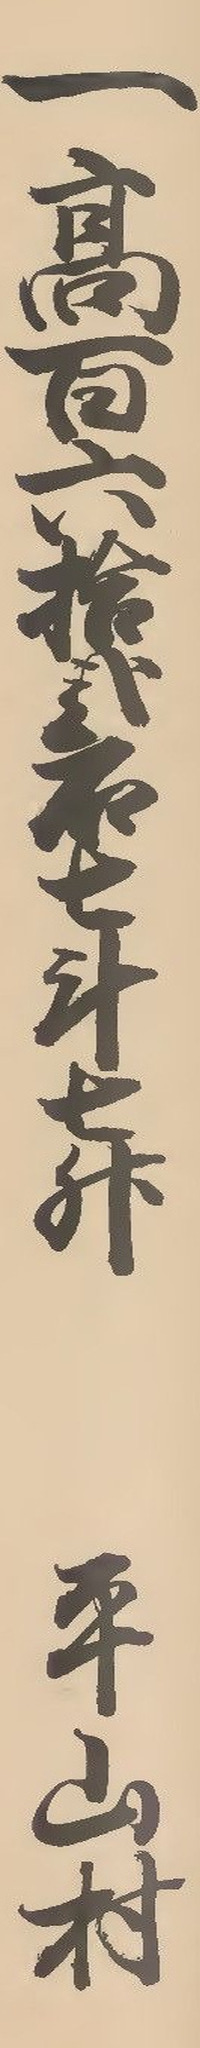一髙百六拾弐石七斗七升平山村
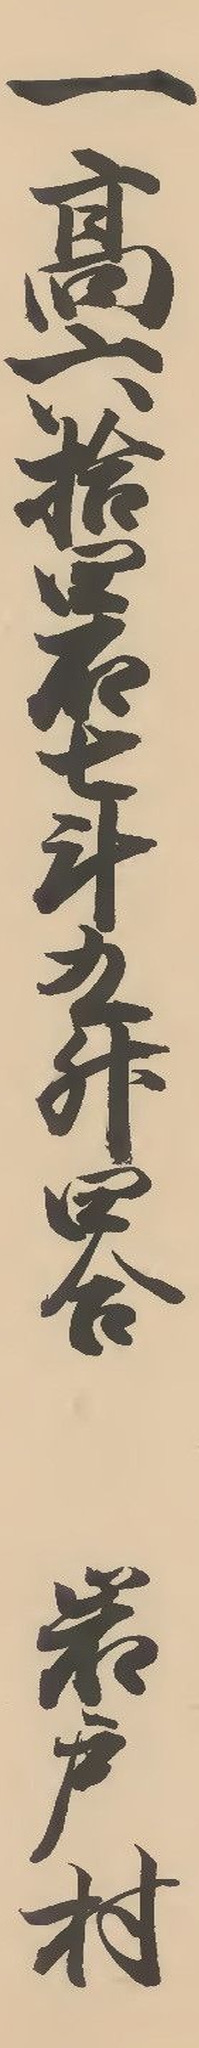一た六拾四石七斗九升四合岩戸村
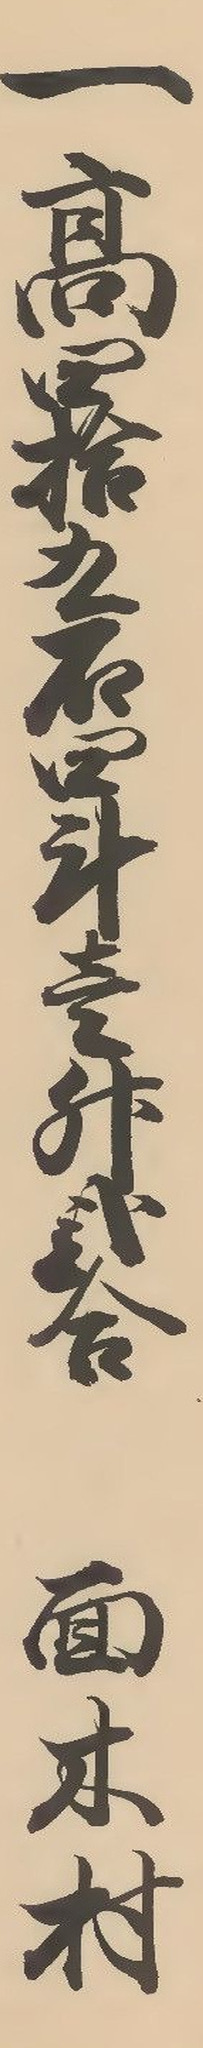一髙四拾九石四斗壱升弐合面木村
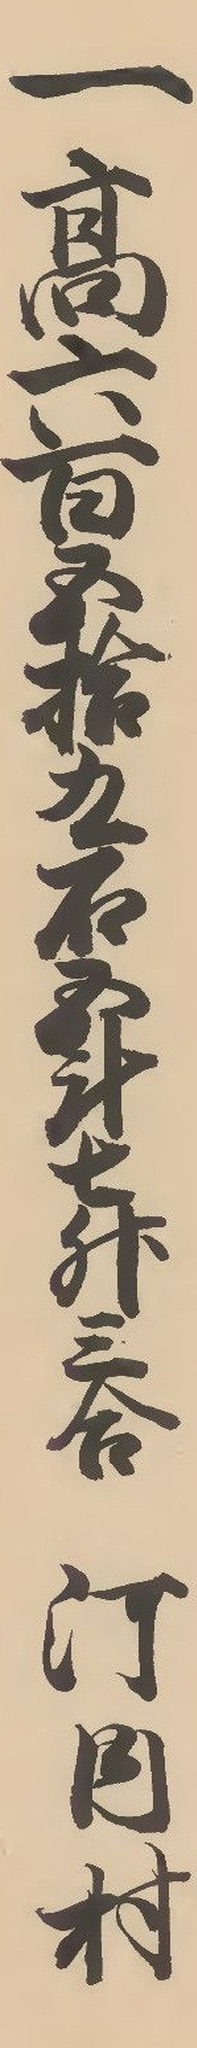一髙六百五拾九石五斗七升三合河内村

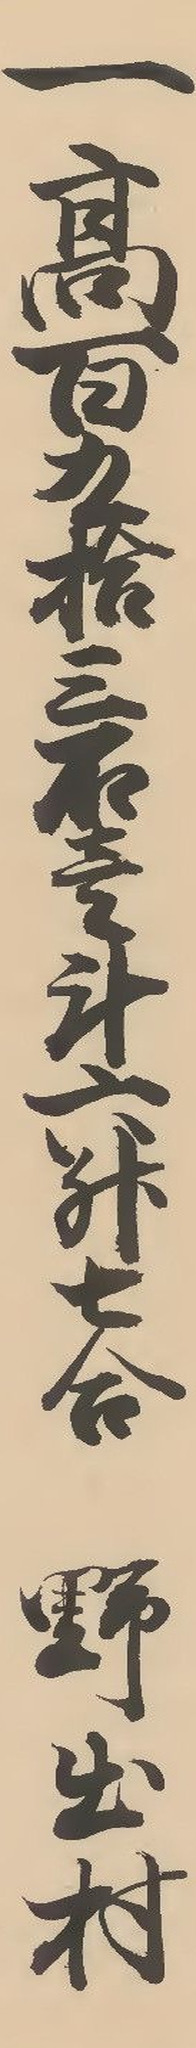一髙百九拾三石壱斗六升七合野出村
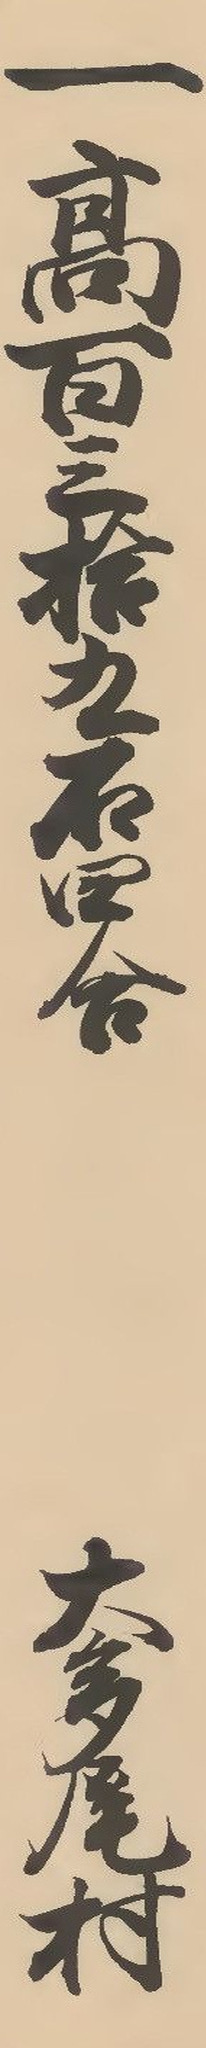一髙百三拾九石四合大多尾村
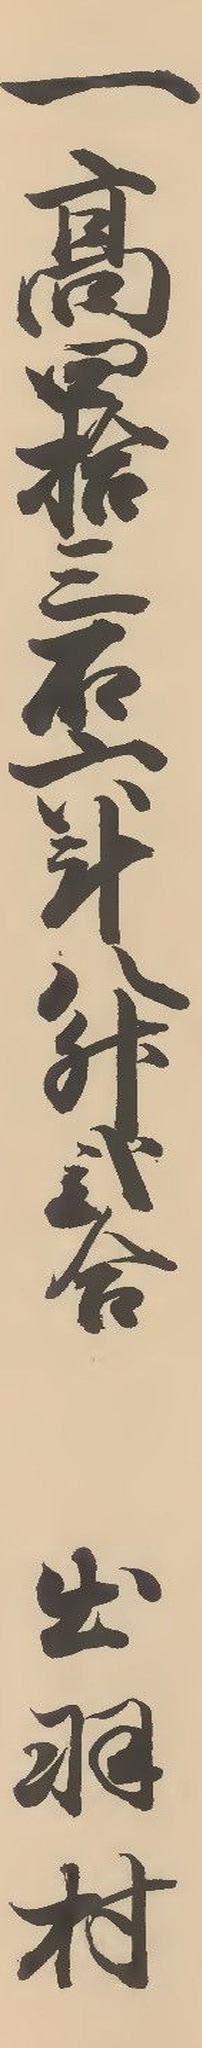一髙四拾三石六斗八升弐合出羽村
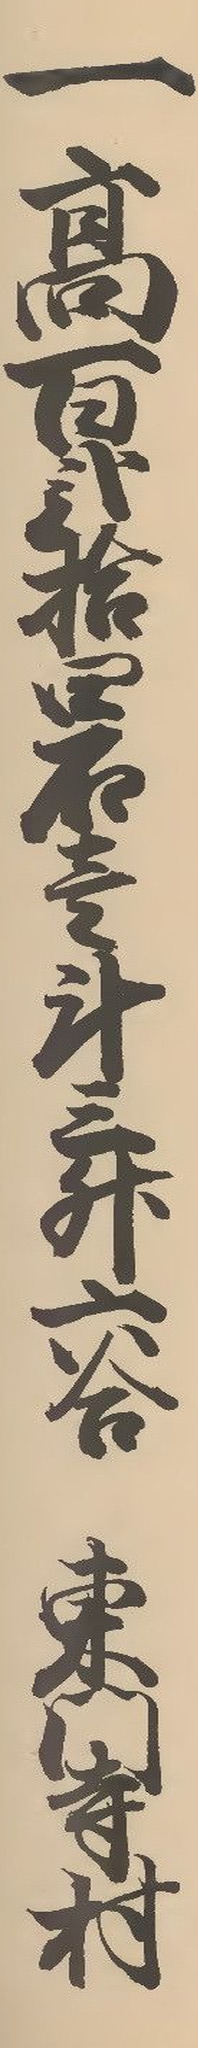一髙百弐拾四石壱斗三升六合東門寺村
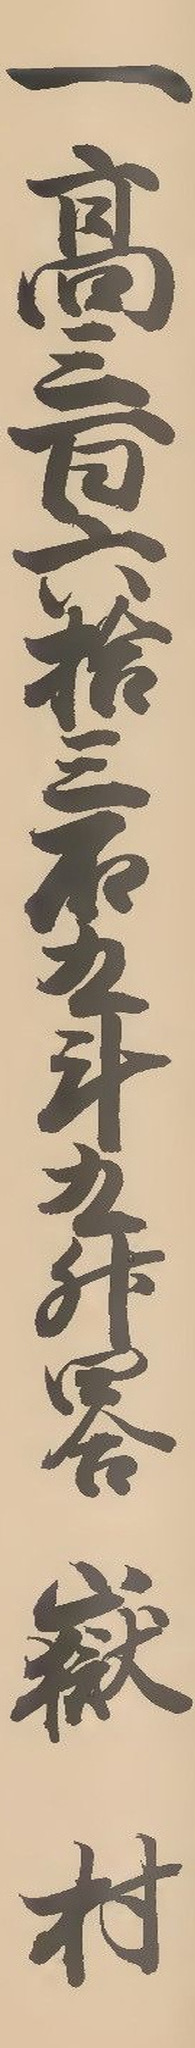一髙三百六拾三石九斗九升四合嶽村
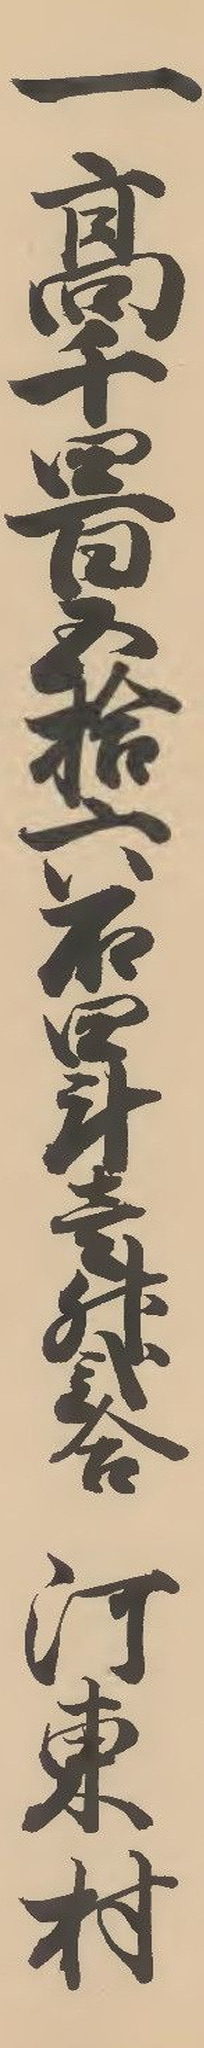一髙千四百五拾六石四斗壱升弐合河東村
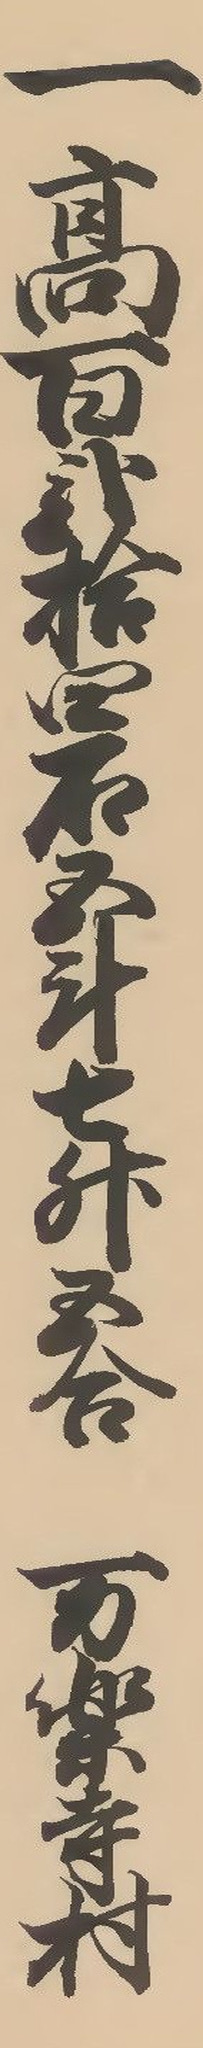一髙百弐拾四石五斗七升五合万樂寺村
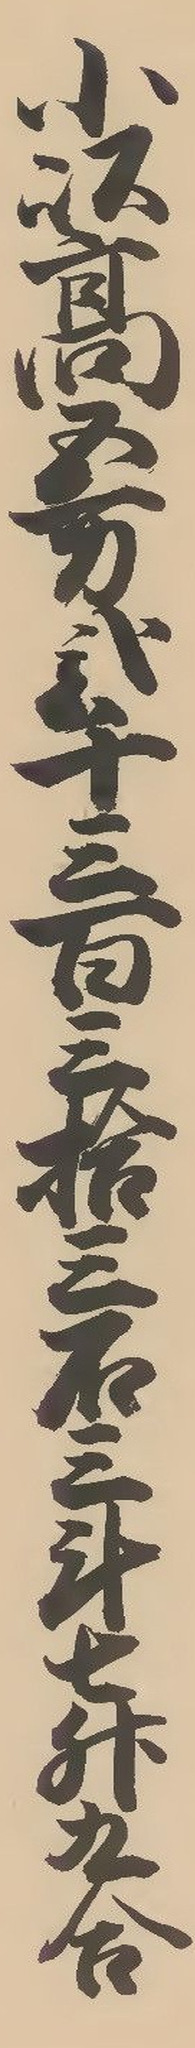小以髙五万弐千三百三拾三石三斗七升九合

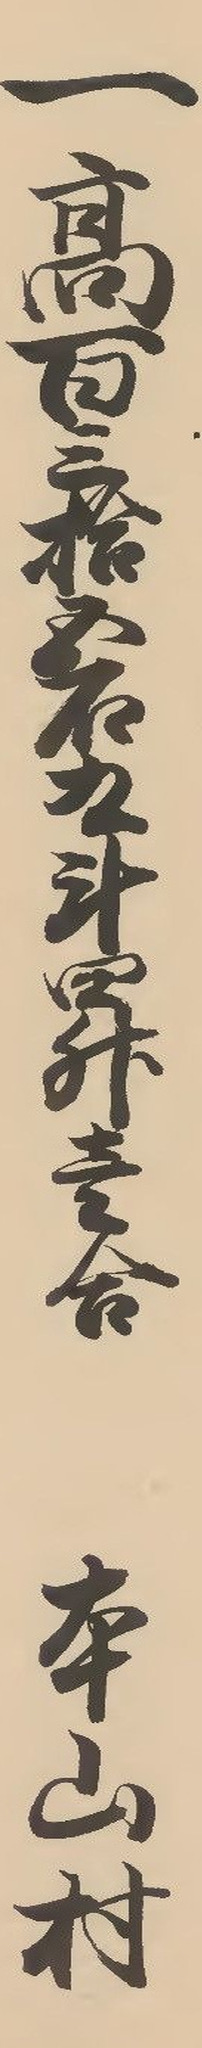一髙百三拾五石九斗四升壱合本山村
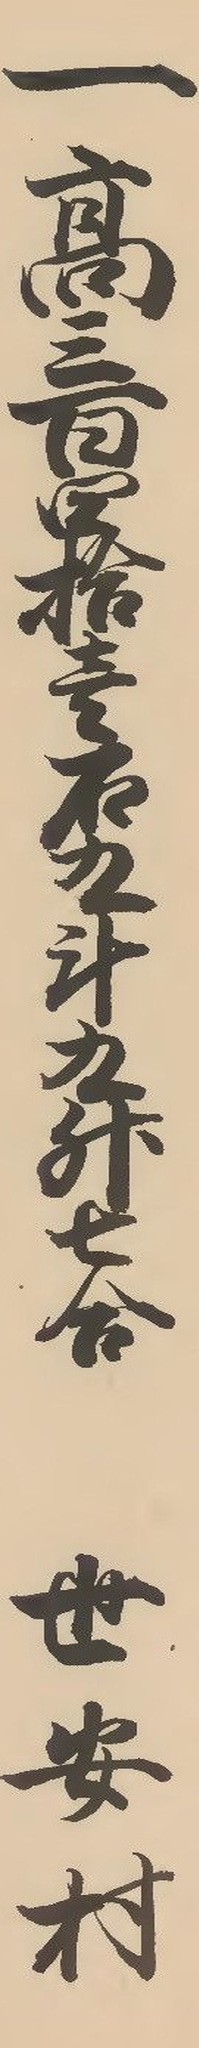一髙三百四拾壱石九斗九升七合世安村
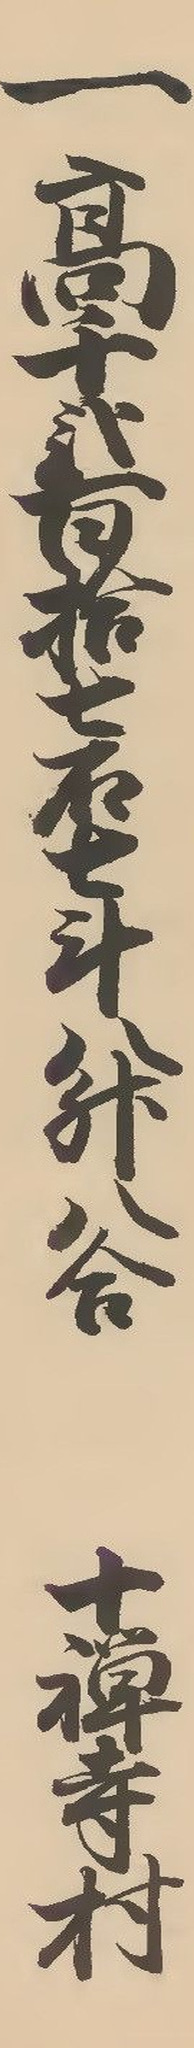一髙千弐百拾七石七斗八升八合十禅寺村
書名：肥後国郷帳
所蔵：国立公文書館 National Archives of Japan
